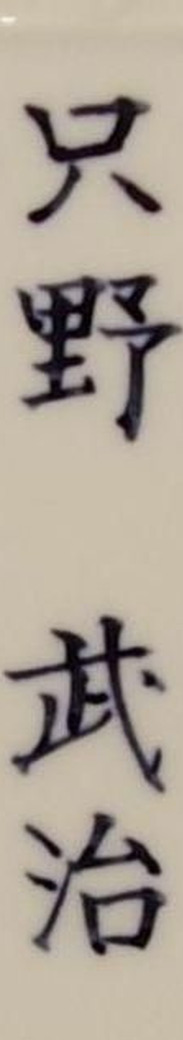只野武治
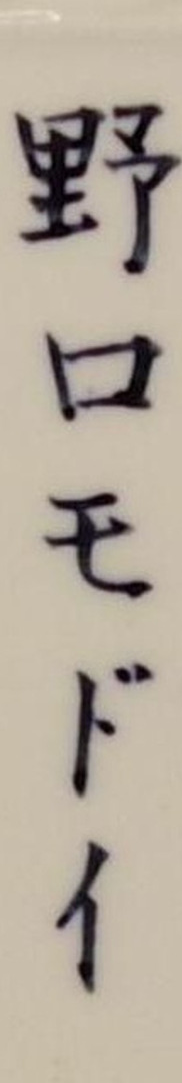野口モドイ
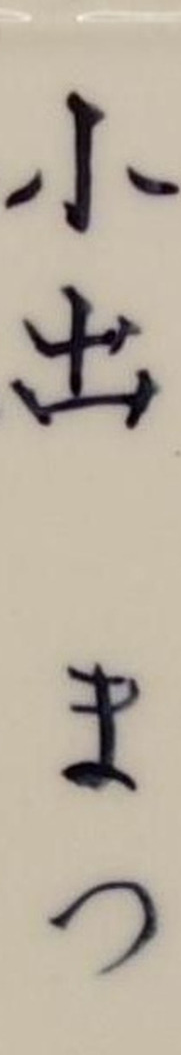小出まつ
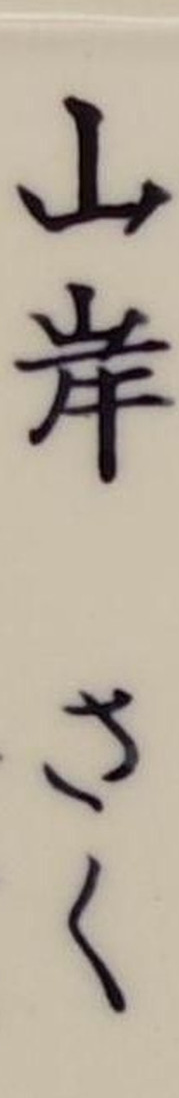山岸さく
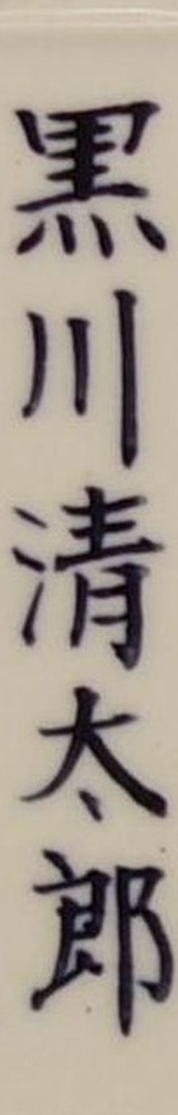黒川清太郎
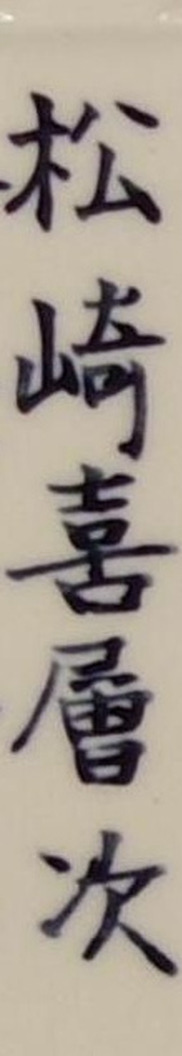松崎喜層次
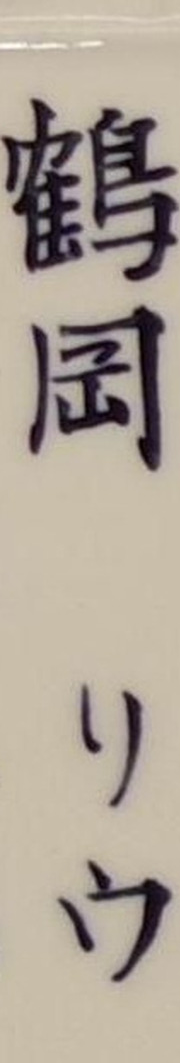鶴岡リウ
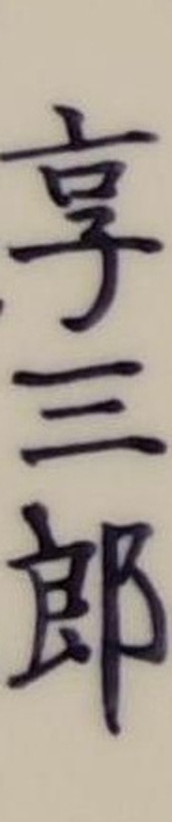享三郎
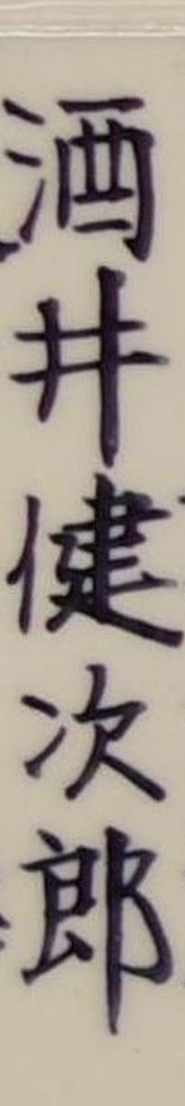酒井健次郎
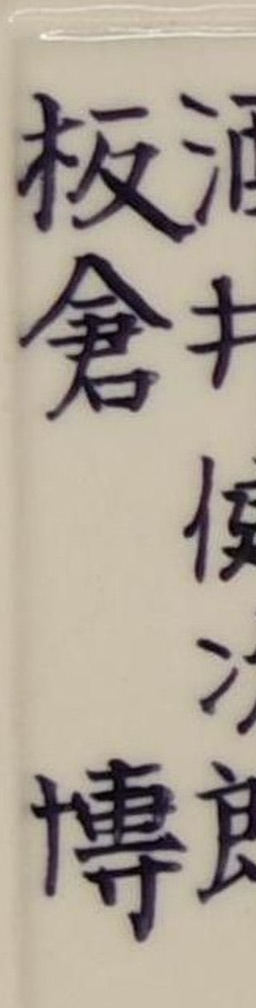板倉博

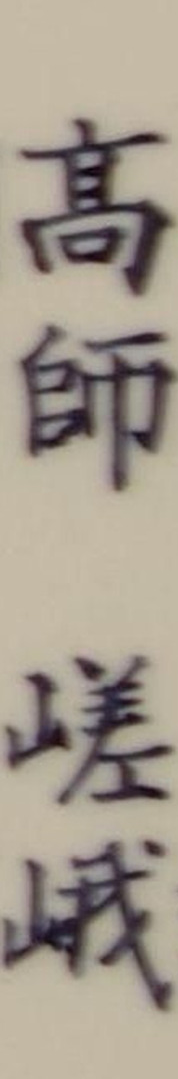高師嵯峨
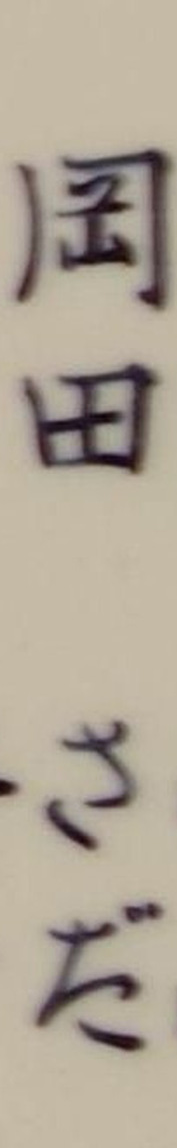岡田さだ
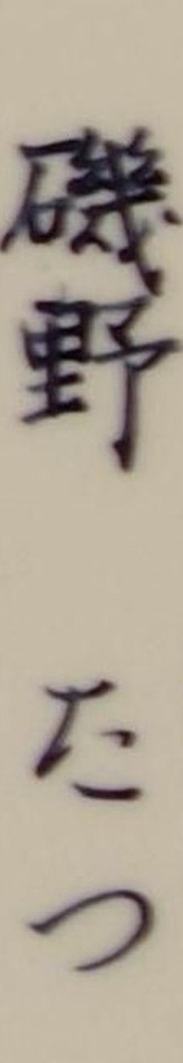磯野たつ
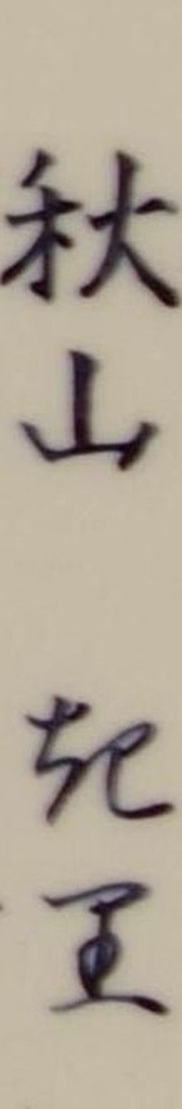秋山きり
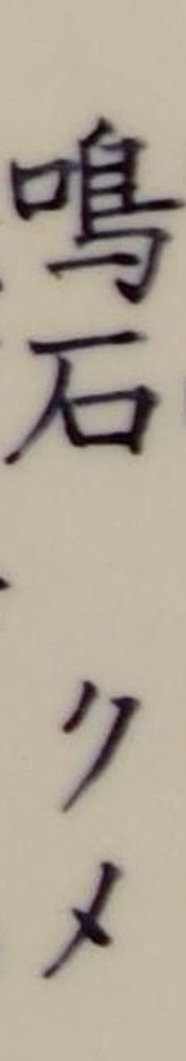鳴石クメ
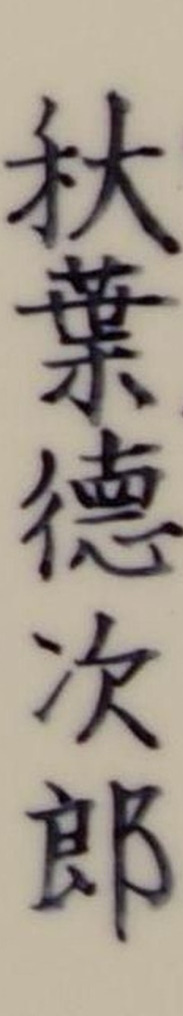秋葉徳次郎
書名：M~S
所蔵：高野山金剛峯寺
